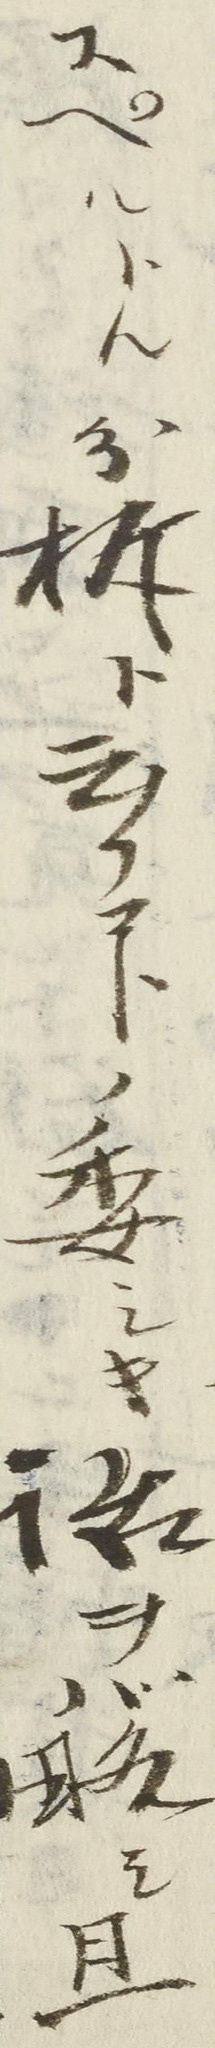スペルトル分析ト云フコトノ委シキ話ヲバ略シ且
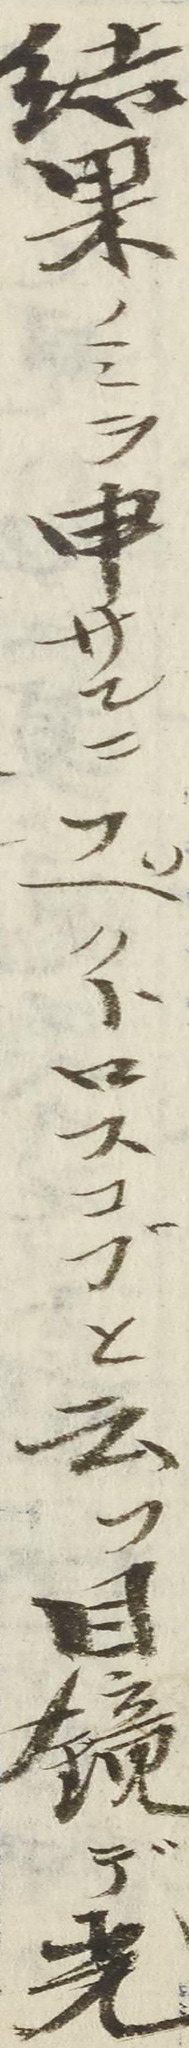結果ノミヲ申サル二フぺクトロㇲコブと云フ目鏡デ光
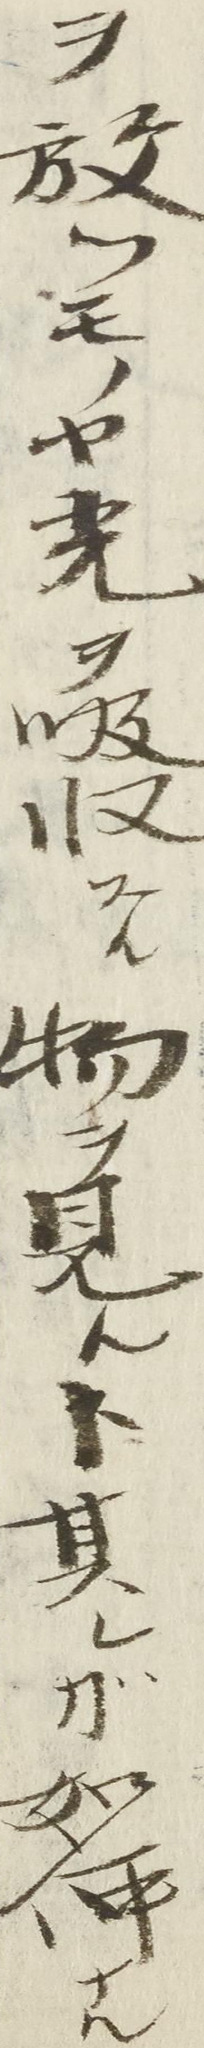ヲ放ツモノヤ光を吸収スル物ヲ見ㇽト其レガ如何ナル
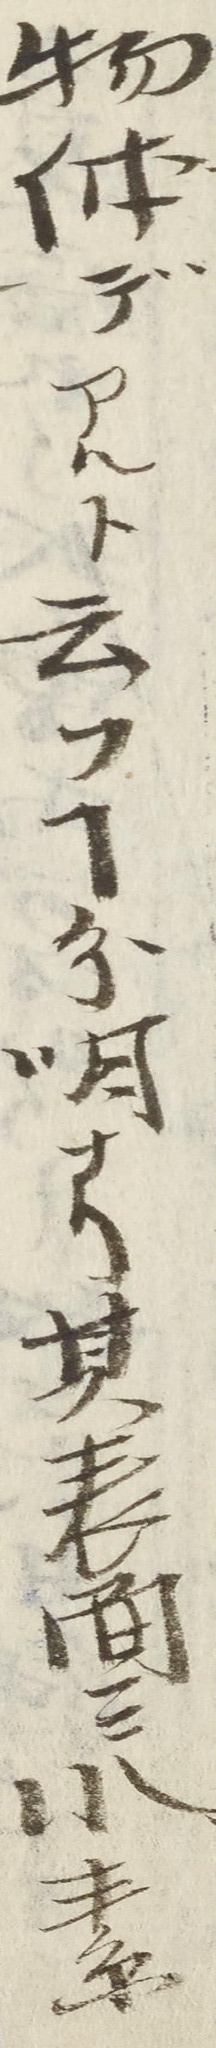物体デアルト云フコト分明ナリ其表面二水素
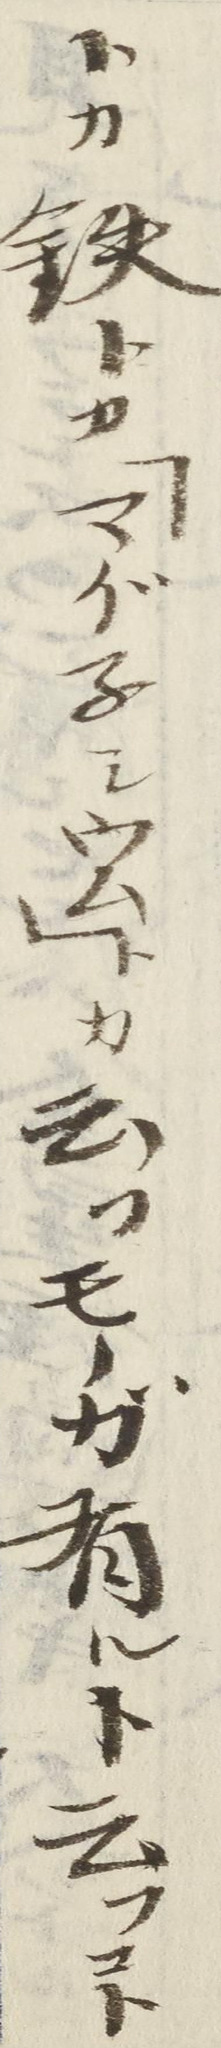トカ鉄ㇳカ「マグ子シウム」トカ云フモノガ有ㇽト云フコト
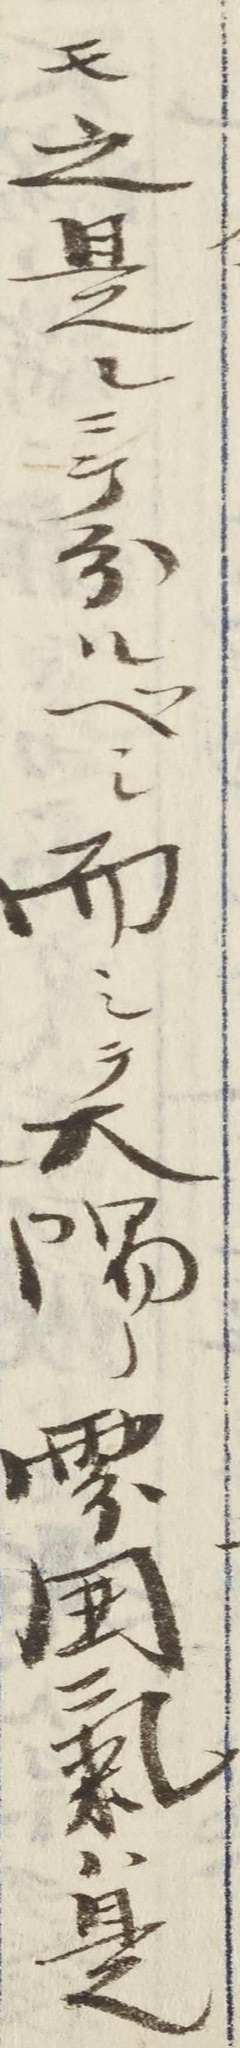モ之是シニテ分ㇽベシ而シテ太陽ノ雰囲気ハ是
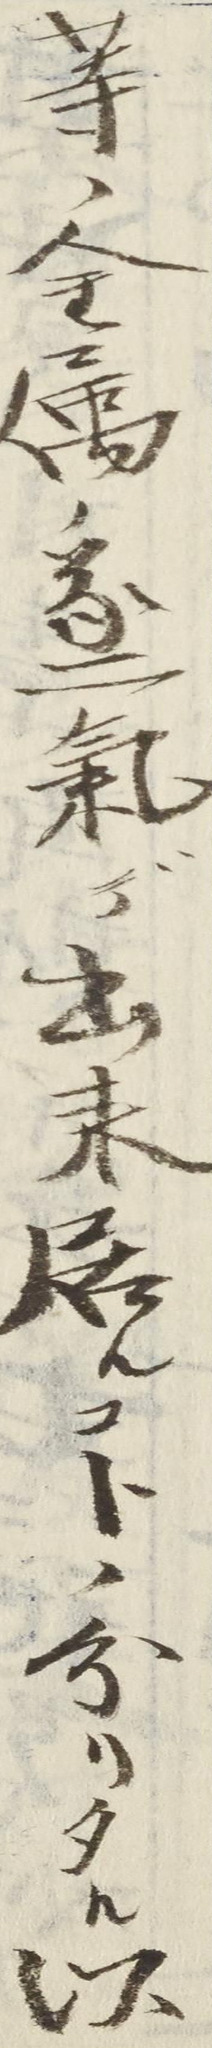等ノ金属ノ蒸気デ出来居ㇽコト分リタル以
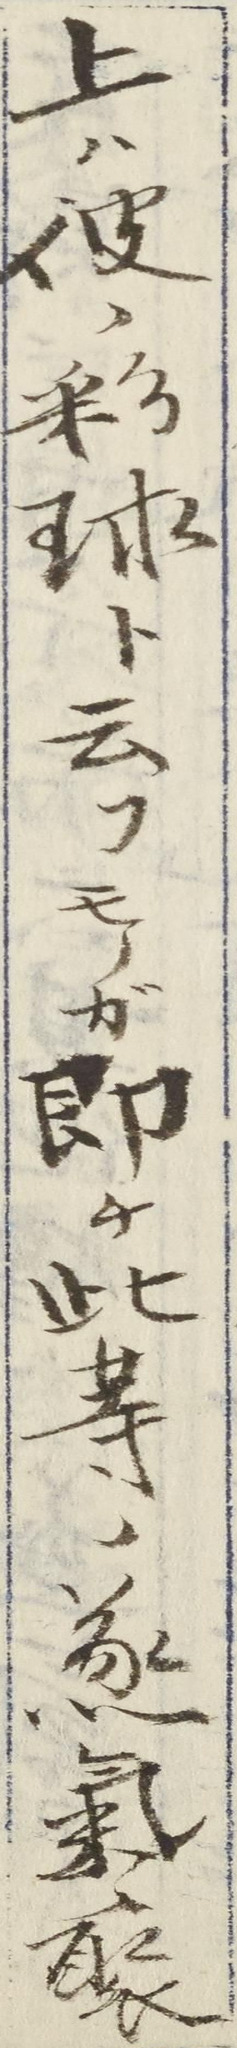上ハ彼ノ彩球ㇳ云フモノが即チ此等ノ蒸気ノ裂
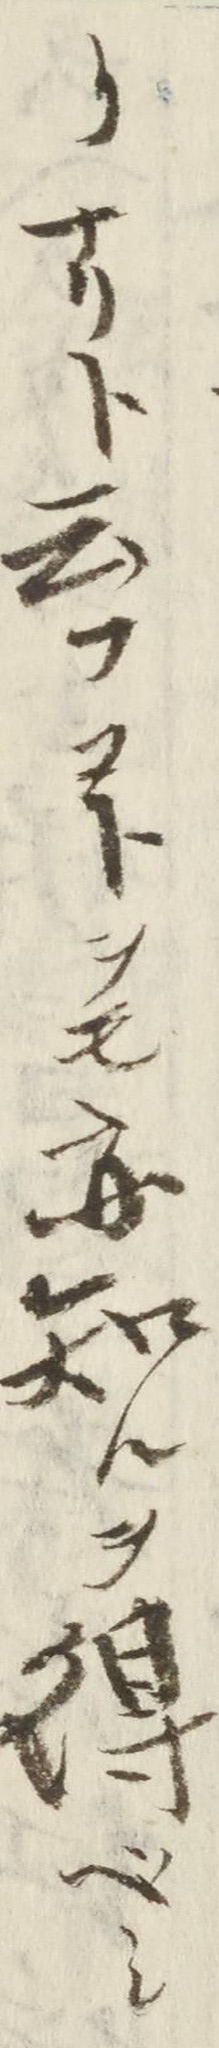リナリト云フコトヲモ亦知ㇽヲ得ベシ

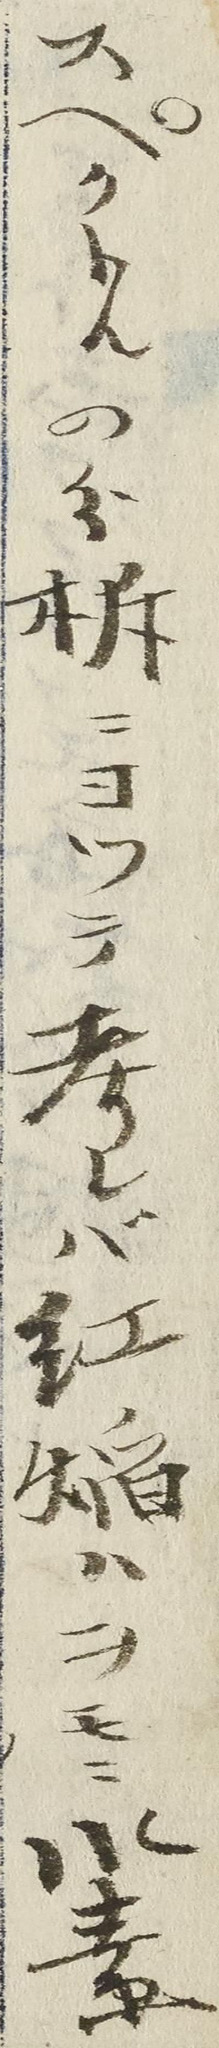ㇲぺクトルノ分析二ヨツテ考レバ紅焔ハヲモニ
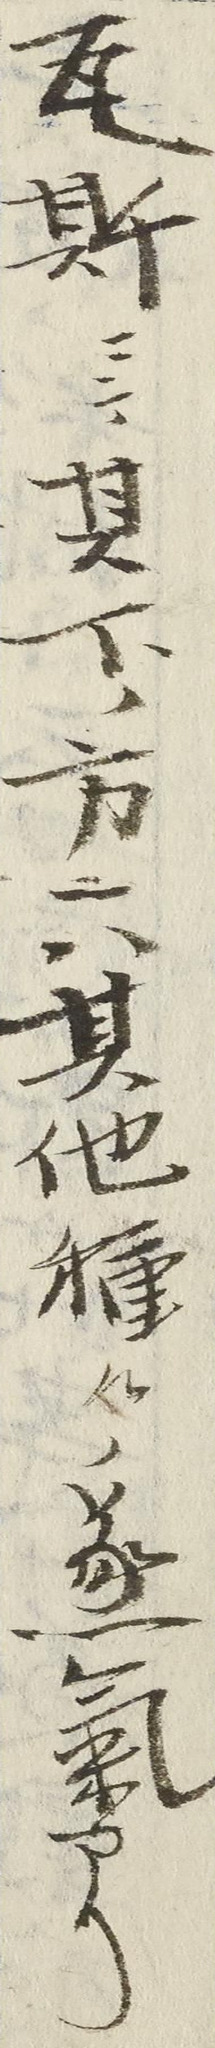瓦斯ニテ其下ノ方二ハ其他種々ノ蒸気アリ
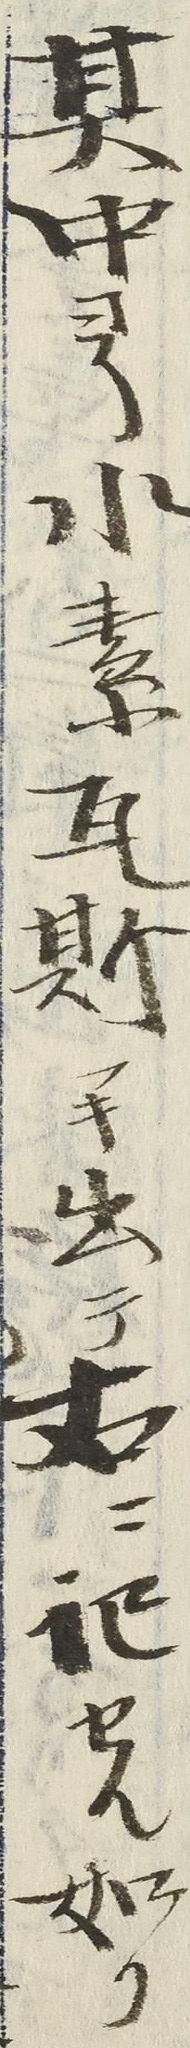其中ヨリ水素瓦斯フキ出テ右二記セㇽ如ク
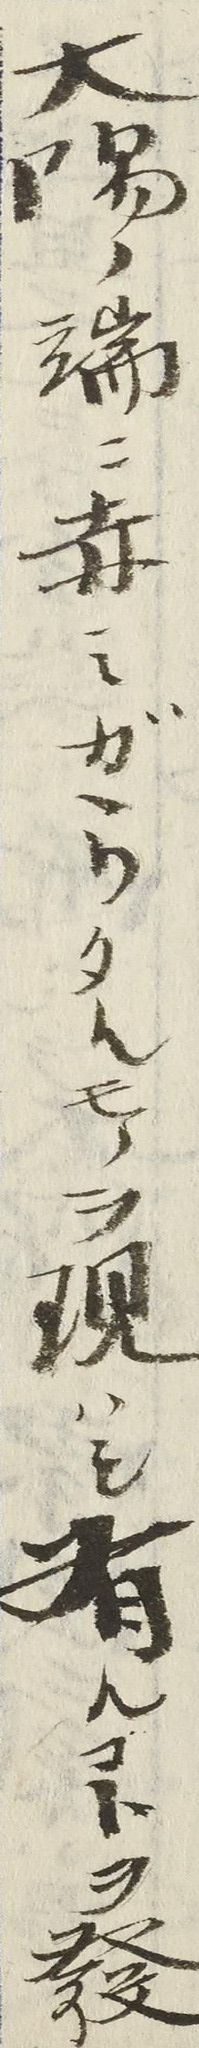太陽ノ端二赤之ガゝリタルモノヲ現ハシ有ㇽコトヲ発
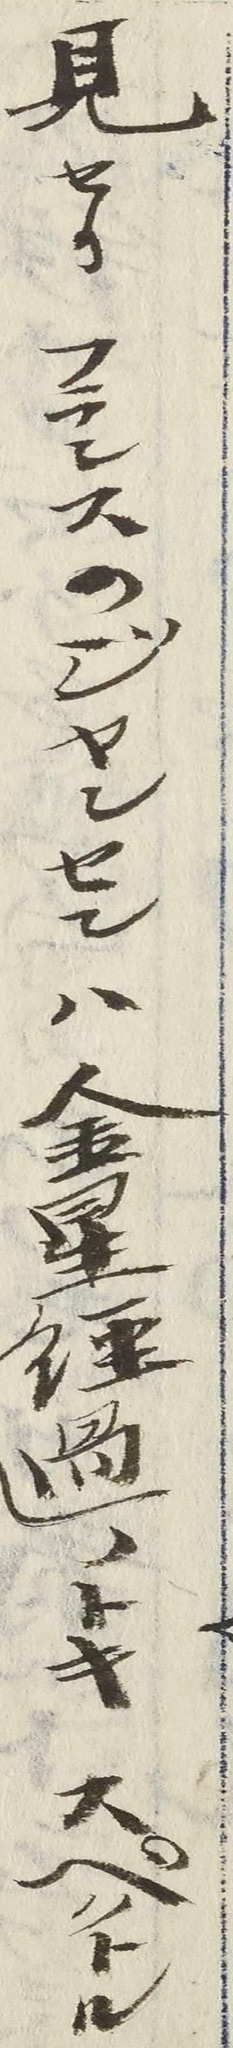見セリフランスのジヤヤレセンハ金星経過ノトキスペクトル
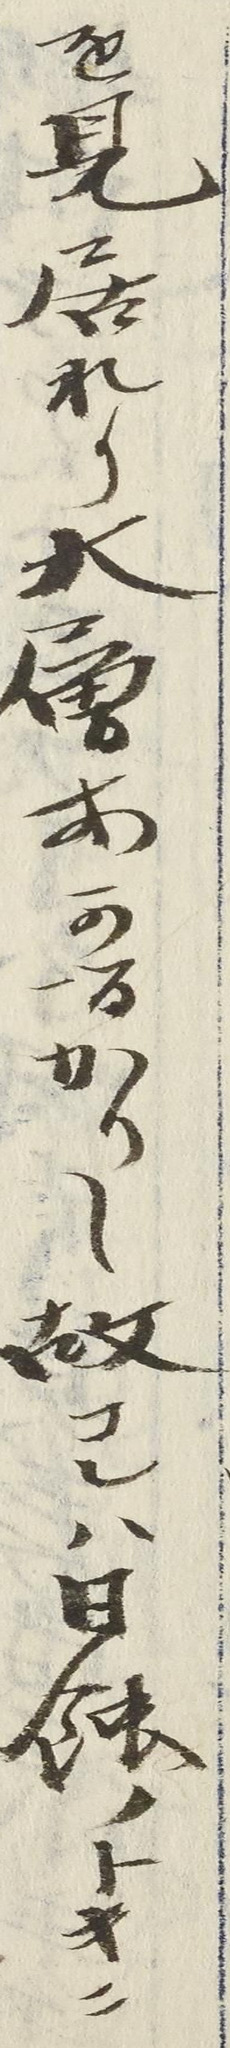を見居れり大層あかるかりし故コレハ日蝕ノトキ二
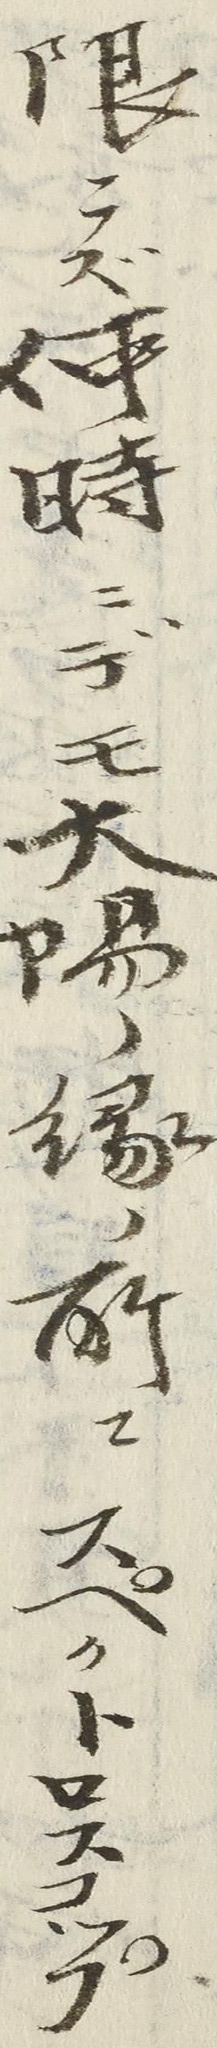限ラズ何時二デモ太陽ノ縁ノ所二ㇲぺクトロスコップ
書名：日蝕録　全
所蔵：東京大学地震研究所図書室 Earthquake Research Institute Library, The University of Tokyo, JAPAN
